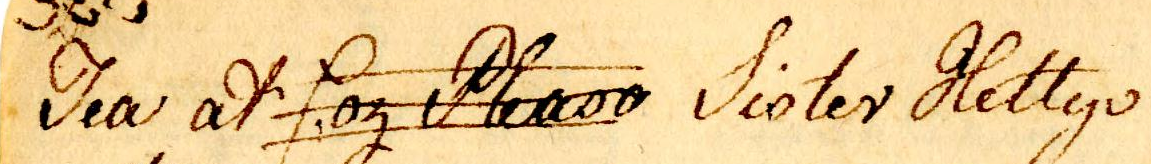Tea at [Coz Pleasa] Sister Hettys
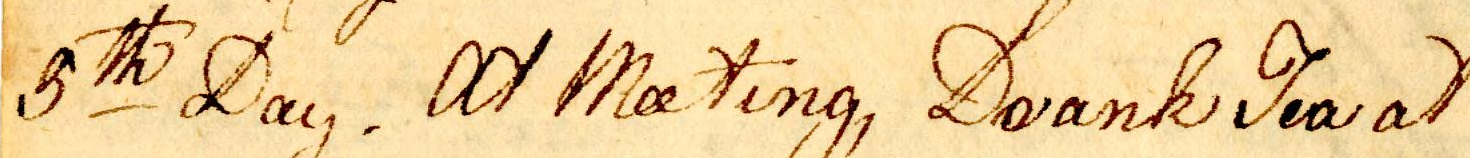5^th Day. At Meeting, Drank Tea at
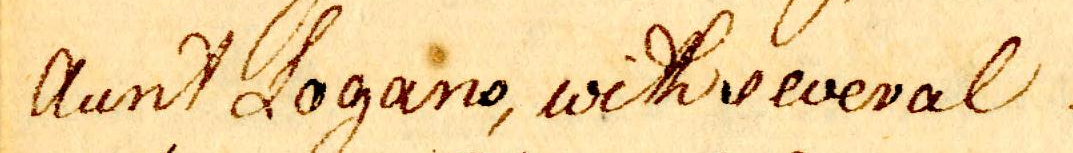Aunt Logans, with several
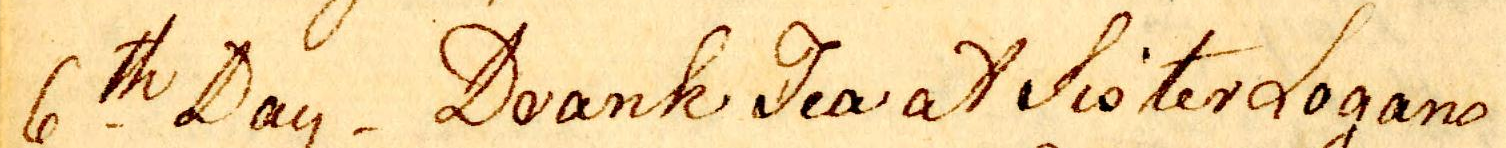6^th Day- Drank Tea at Sister Logans
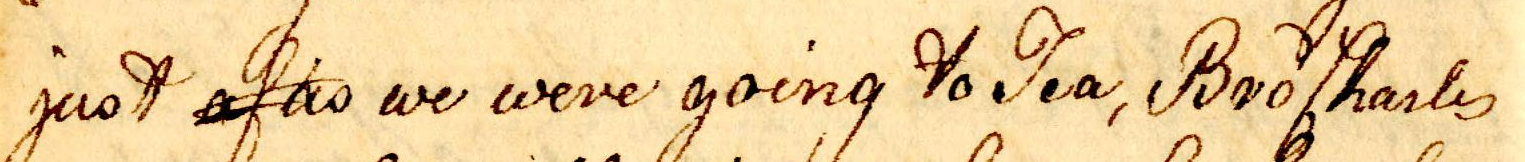just [af] as we were going to Tea, Bro Charles
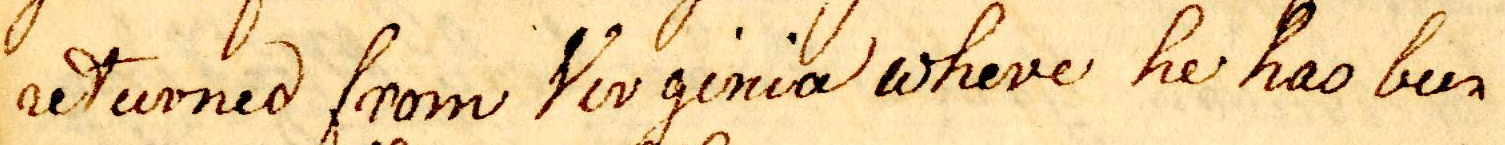returned from Virginia where he has been
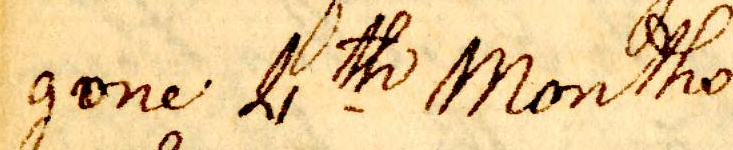gone 4^th Months
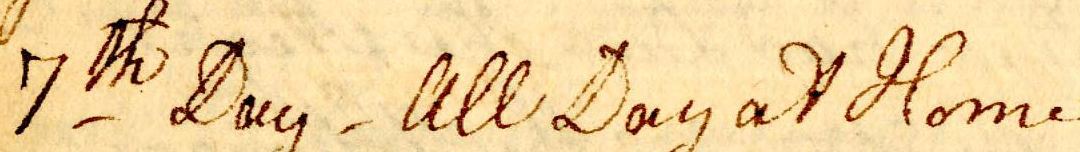7^th Day- All Day at Home
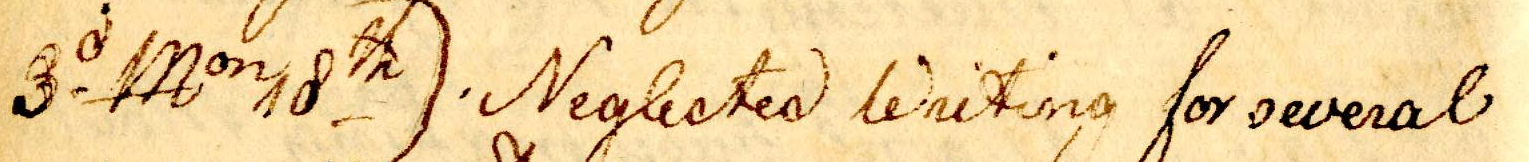3^d. M^on 18^th) Neglected Writing for several
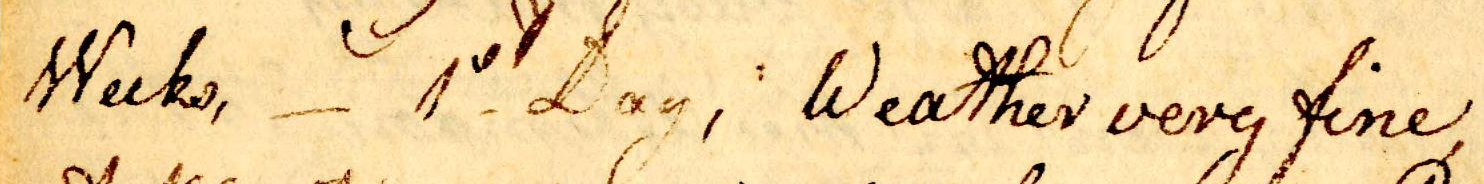Weeks,- 1^st Day, Weather very fine
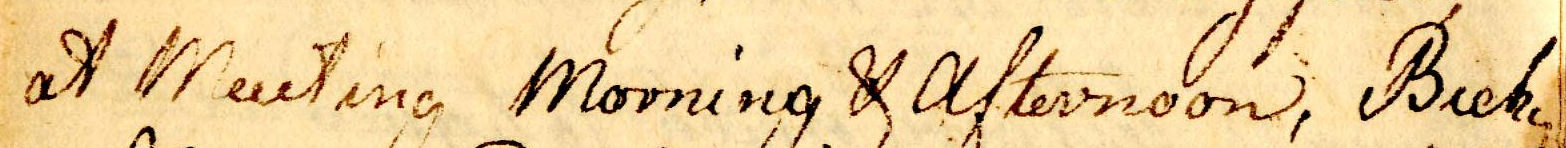at Meeting Morning & Afternoon, Becky
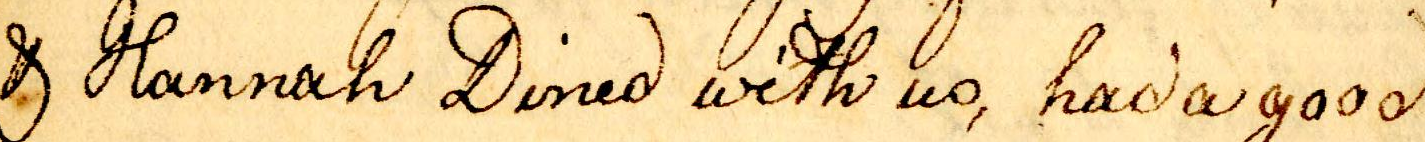& Hannah Dined with us, had a good
